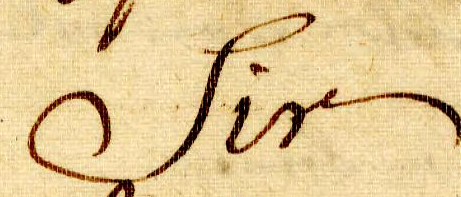Sir
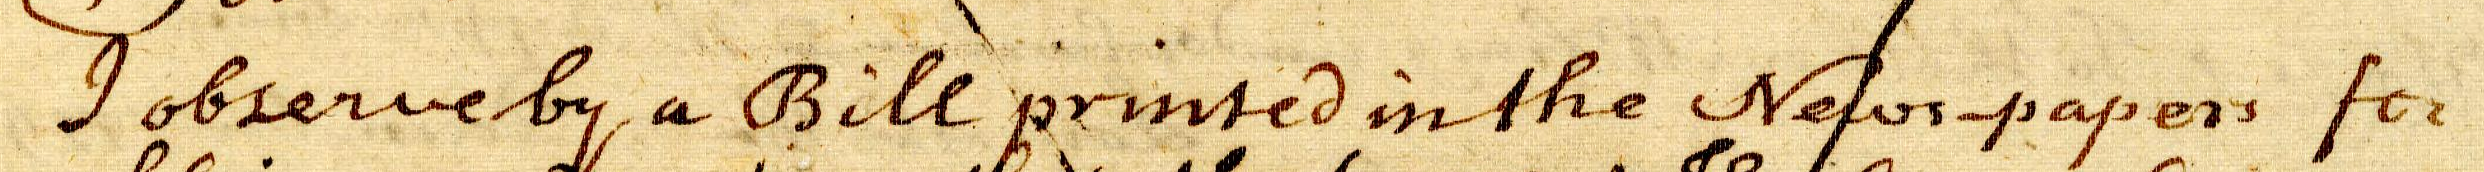I observe by a Bill printed in the Newspapers for
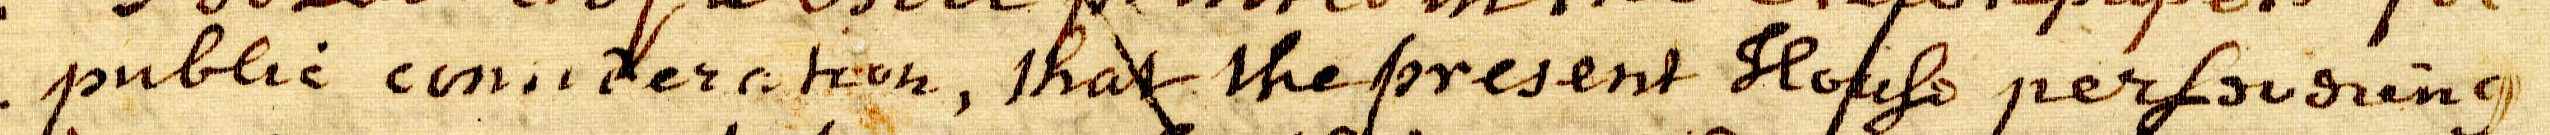public consideration, that the present House persevering
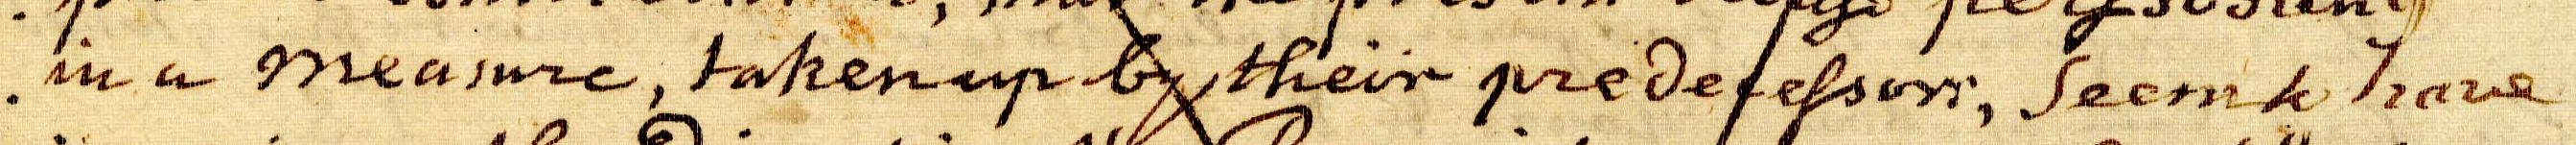in a Measure, taken up by their predecessor, Seem to have
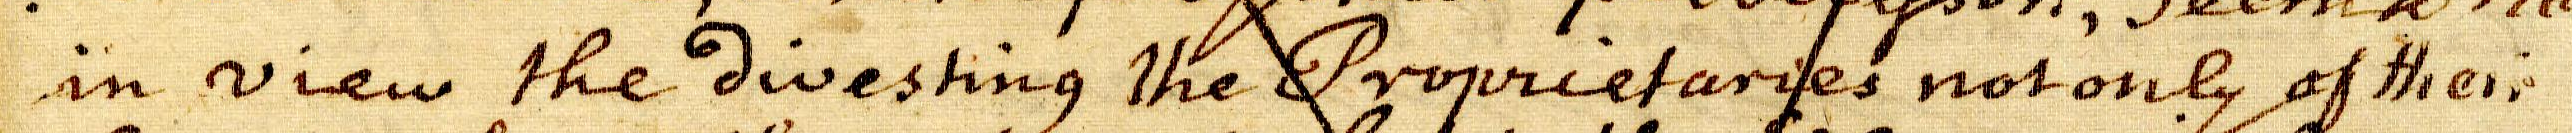in view the divesting the Proprietaries not only of their
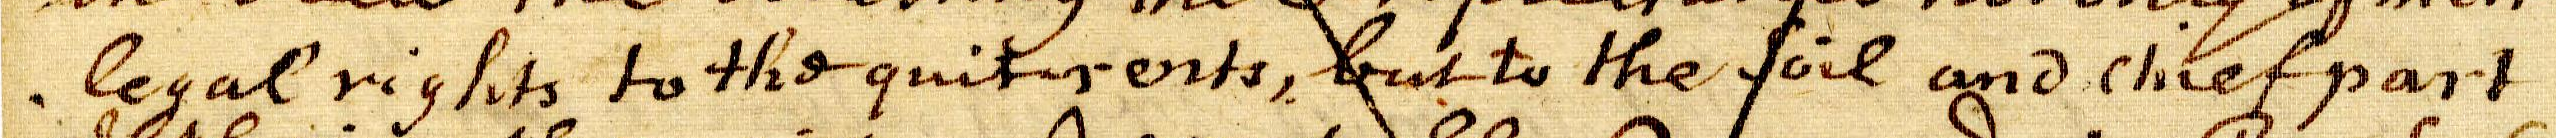legal rights to the {quit} rents, but to the Soil and chief part
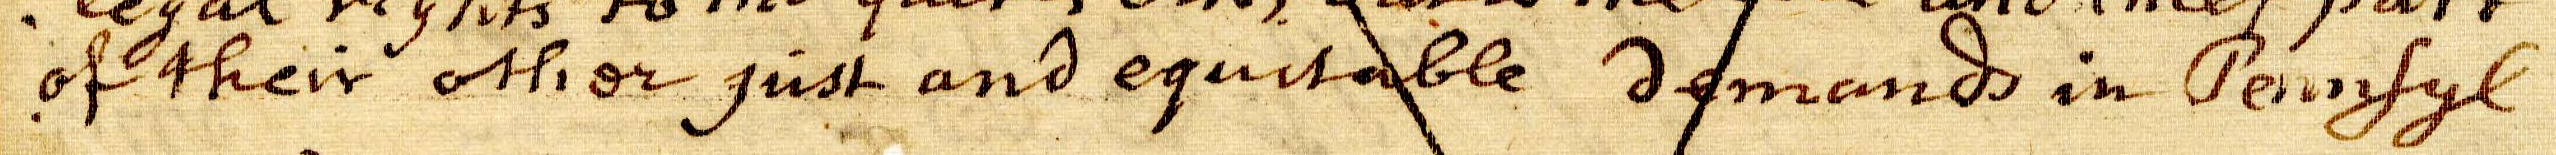of their other just and equitable demands in Pennsyl
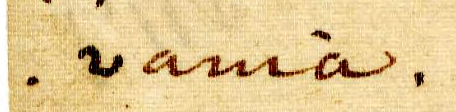-vania.
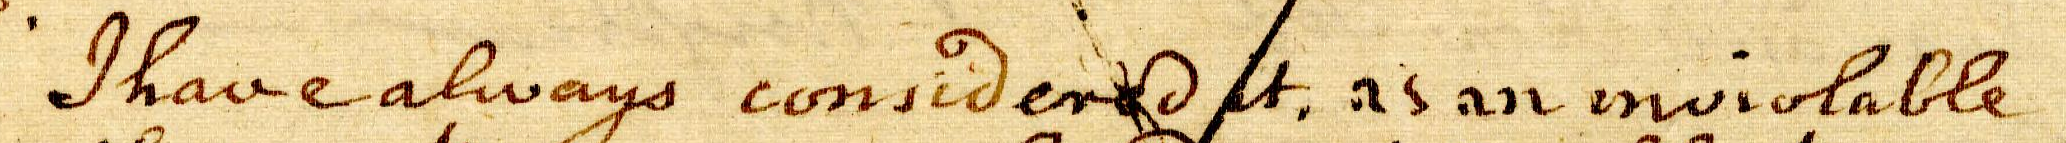I have always considered it, as an enviable
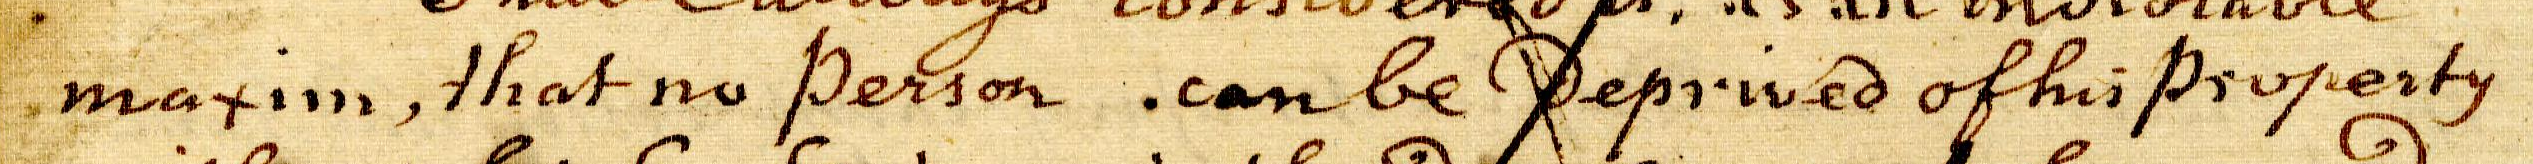maxim, that no Person can be Deprived of his Property
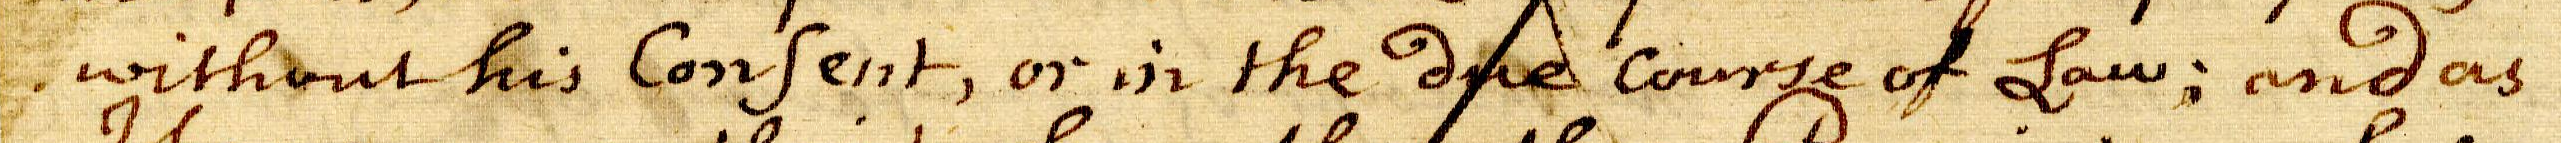without his ConSent, or in the due Course of Law; and as
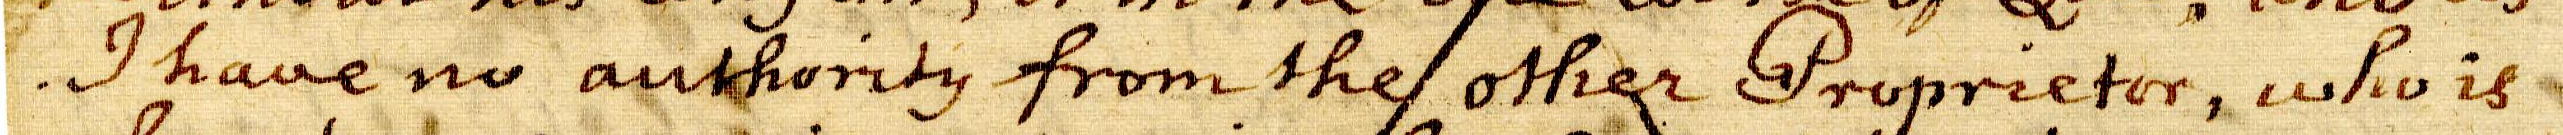I have no authority from the other Proprietor, who is
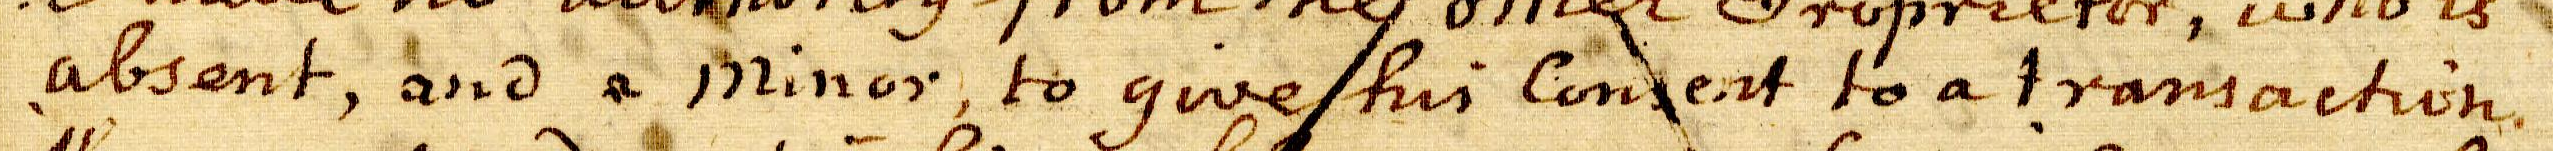absent, and a Minor, to give his Consent to a transaction.
